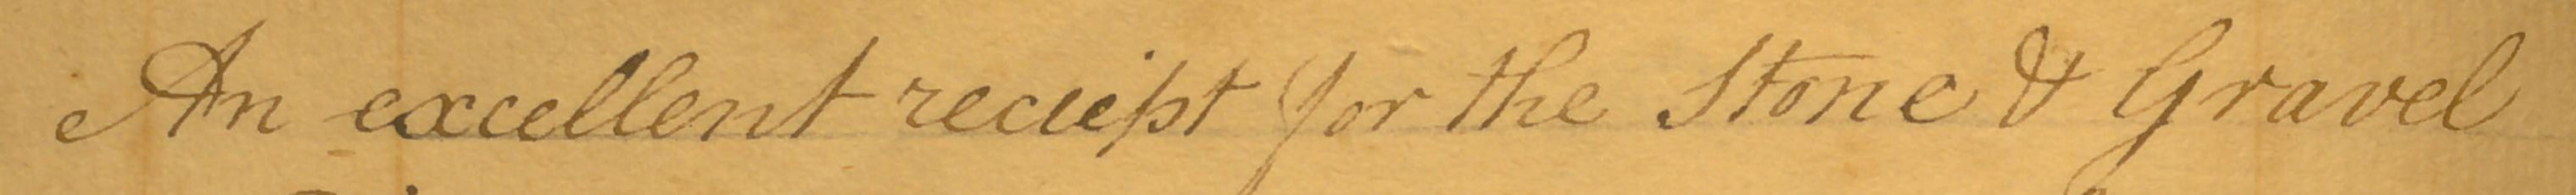An excellent receipt for the Stone & Gravel
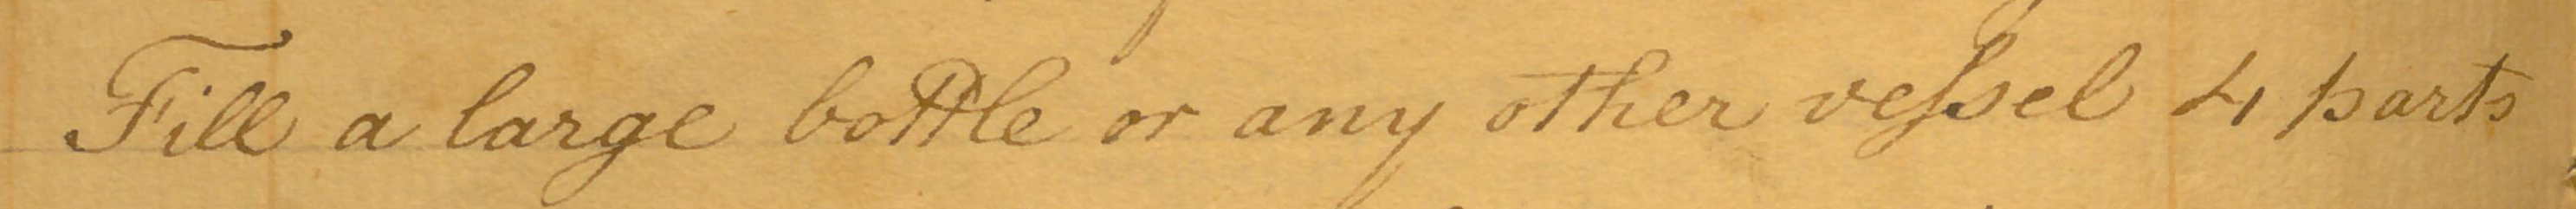Fill a large bottle or any other vessel 4 parts
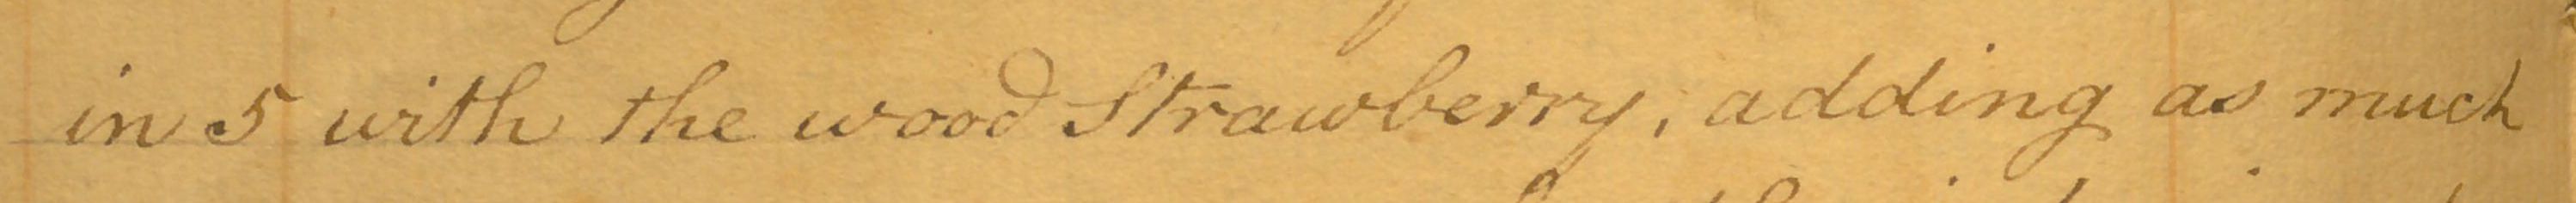in 5 with the wood Strawberry, adding as much
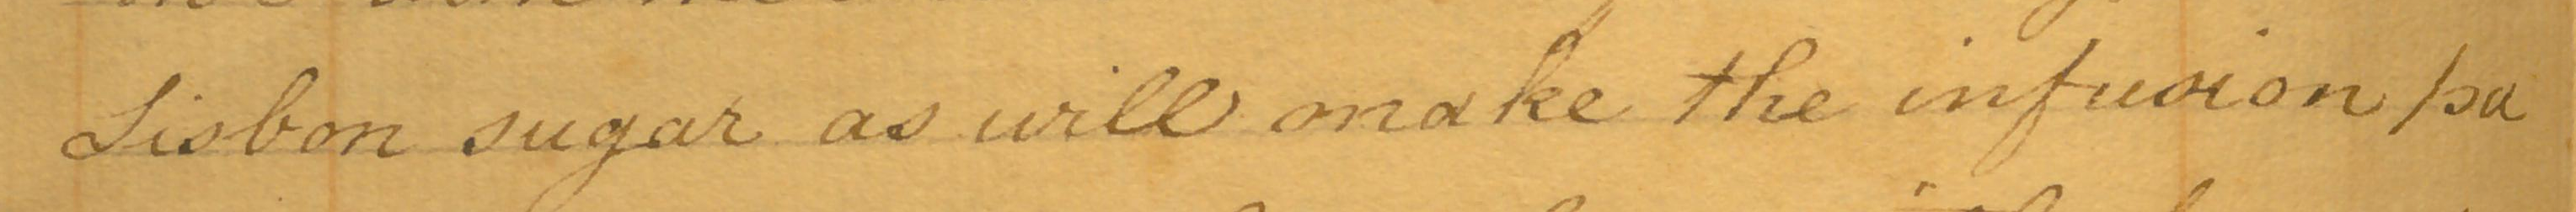Lisbon sugar as will make the infusion pa
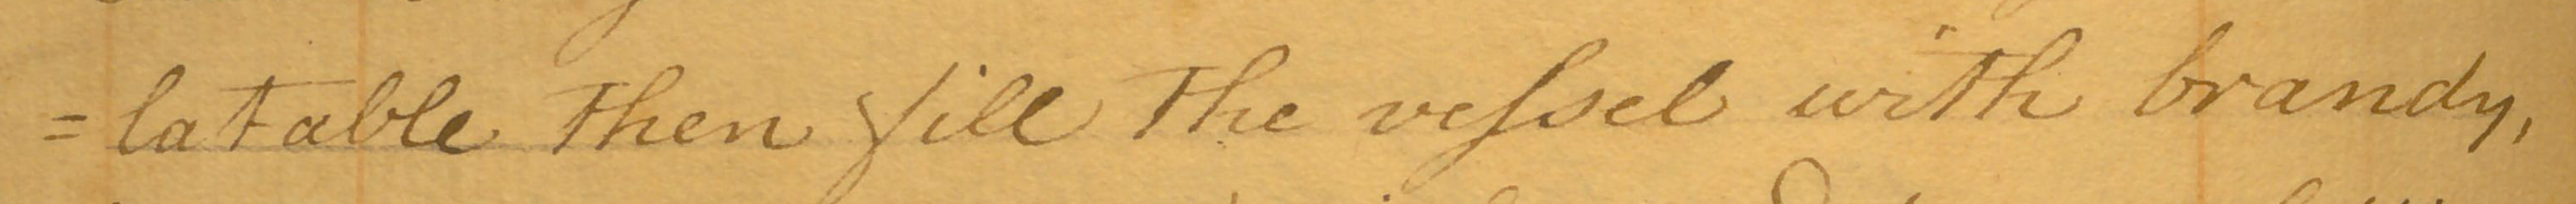-latable then fill the vessel with brandy,
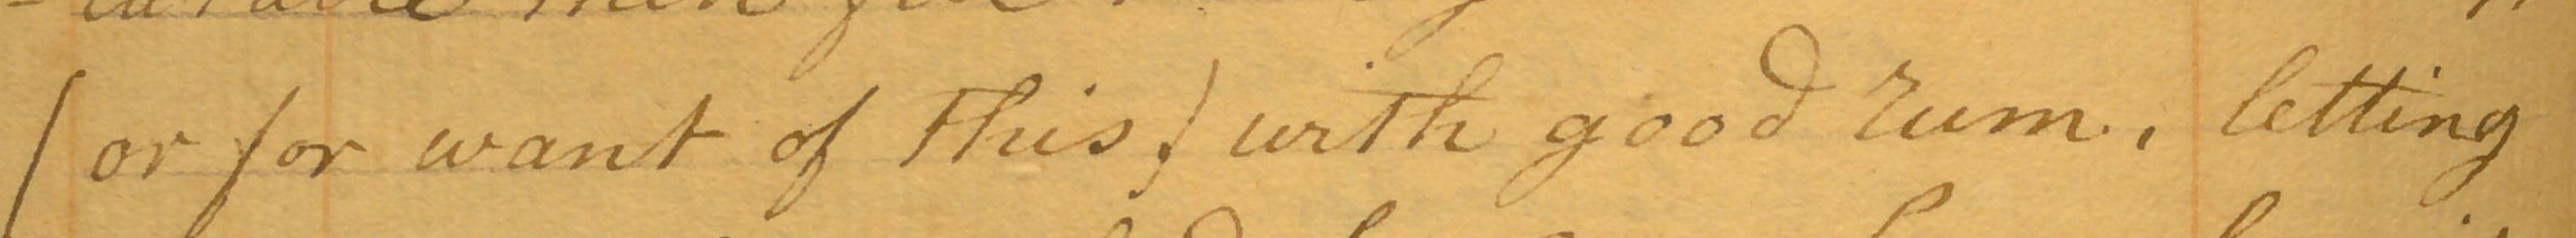(or for want of this) with good rum, letting
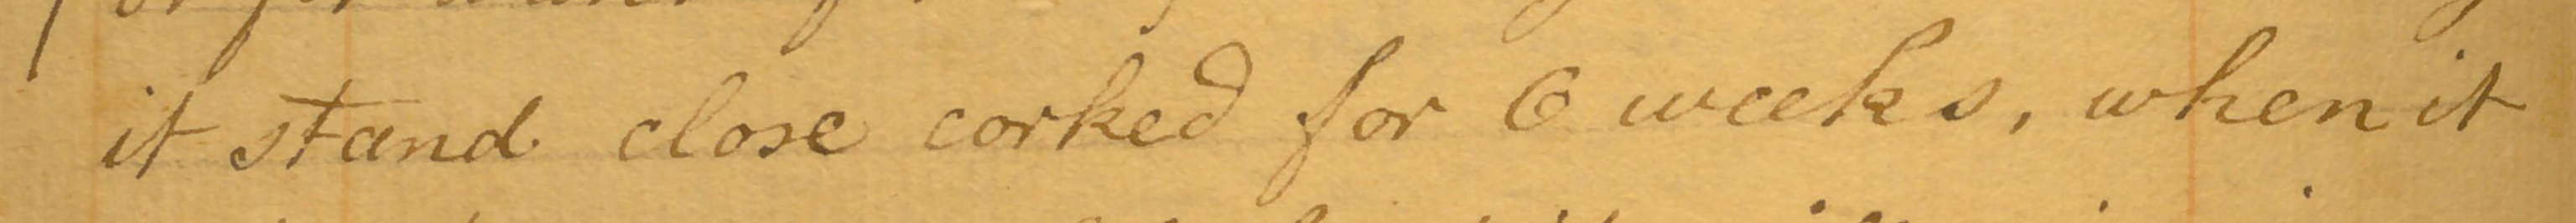it stand close corked for 6 weeks, when it
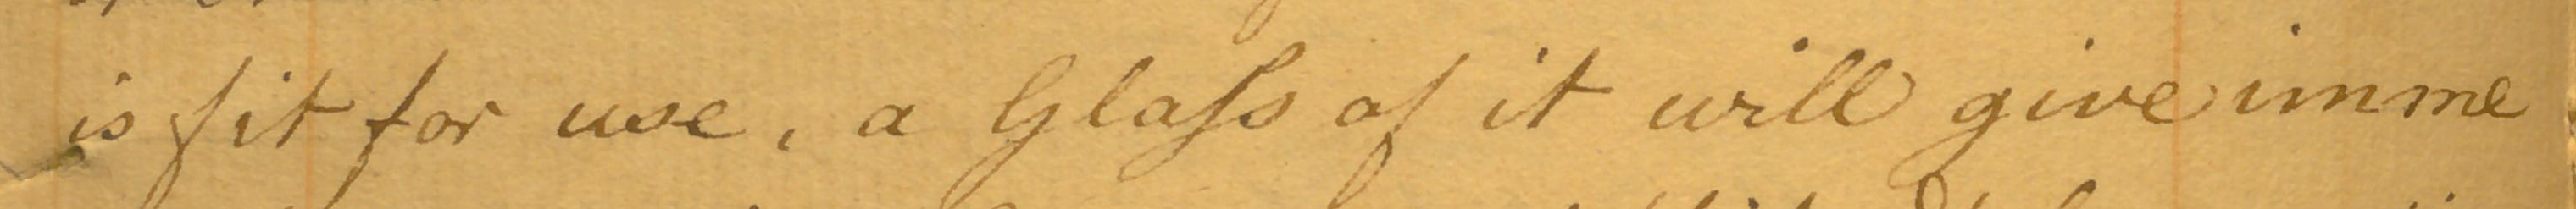is fit for use, a Glass of it will give imme
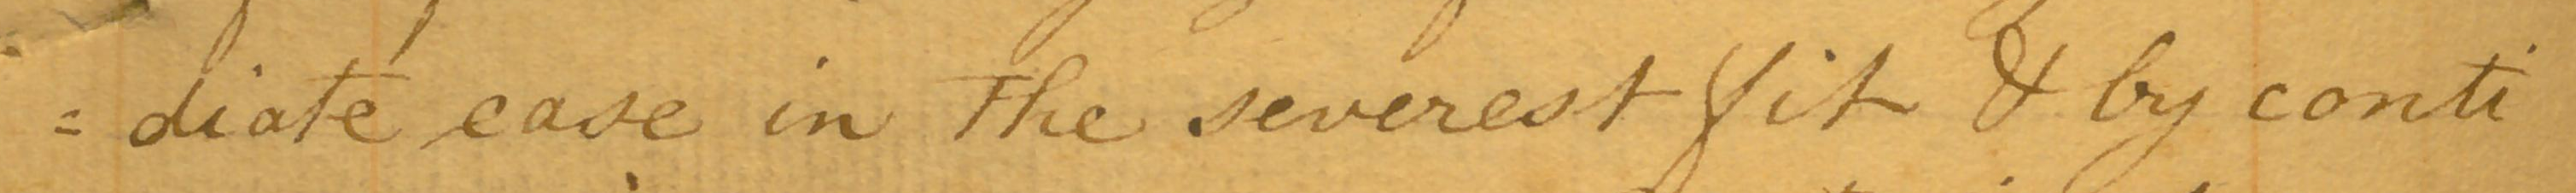-diate ease in the severest fit & by conti
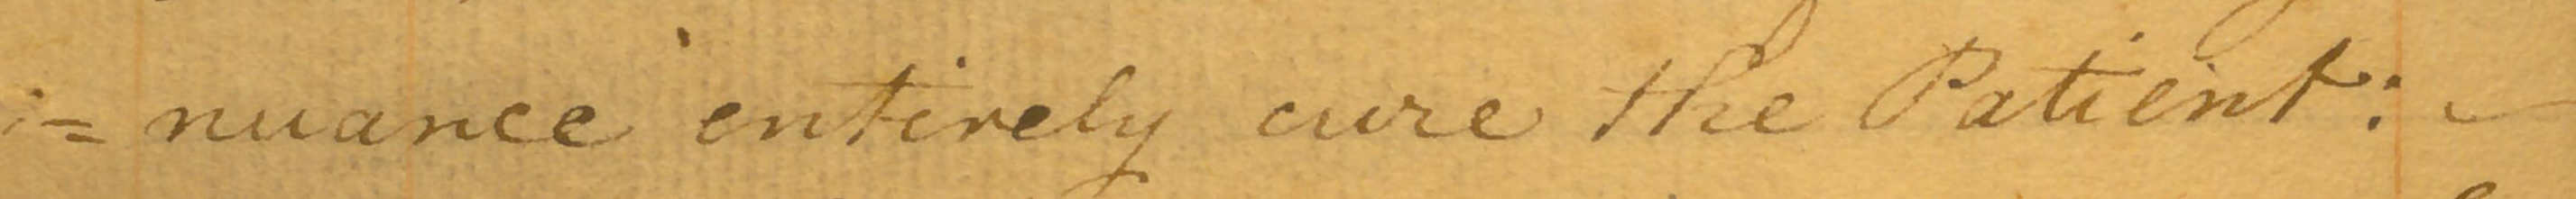-nuance entirely cure the Patient:-
